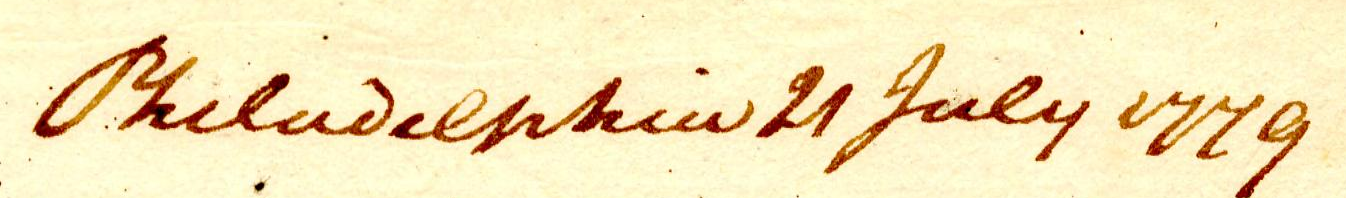Philadelphia 21 July 1779
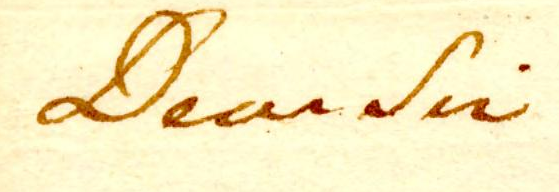Dear Sir
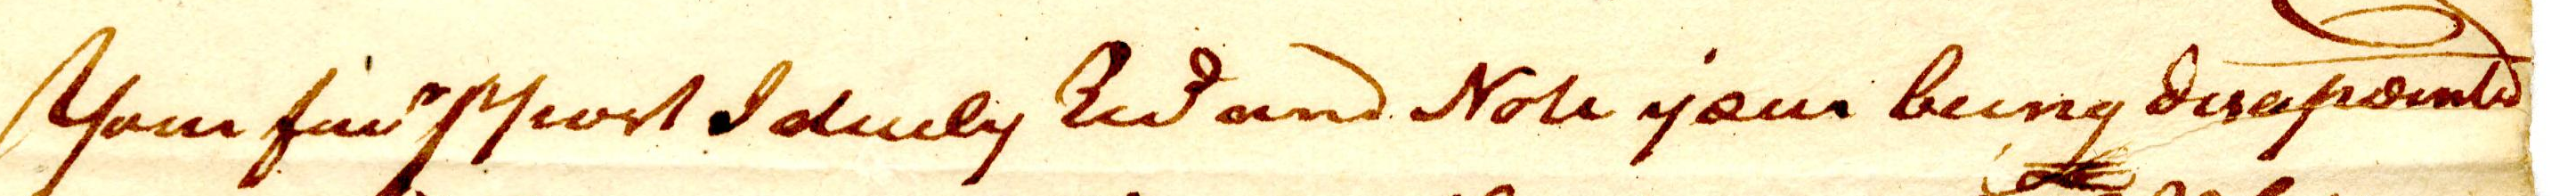Your fav^r 17 last I duly rec^d and Note your being disapointed
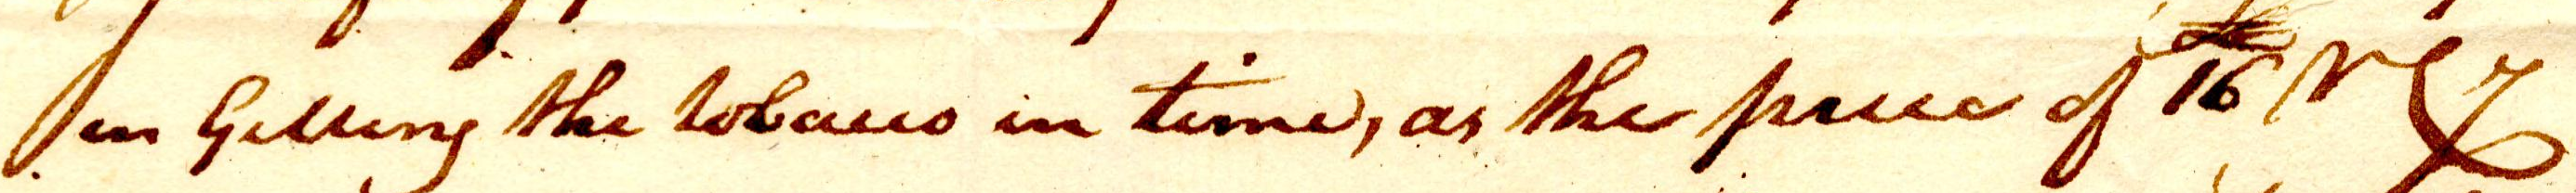in Getting the Tobacco in time, as the price of 16 VCY
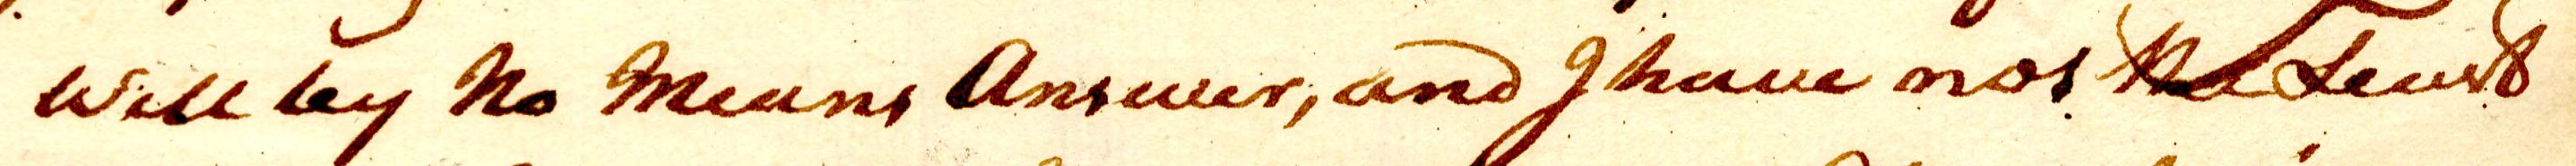will by no Means Answer, and I have not the Least
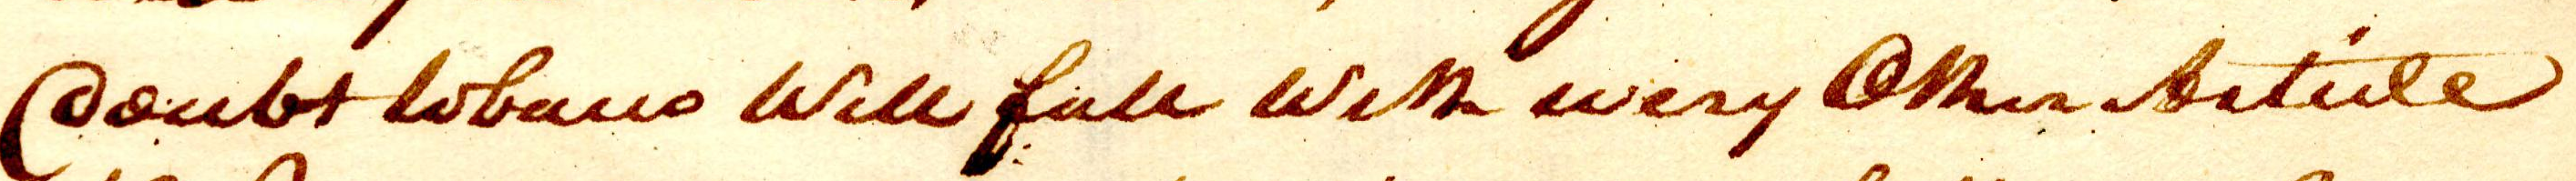doubt tobacco Will fall with every Other Article
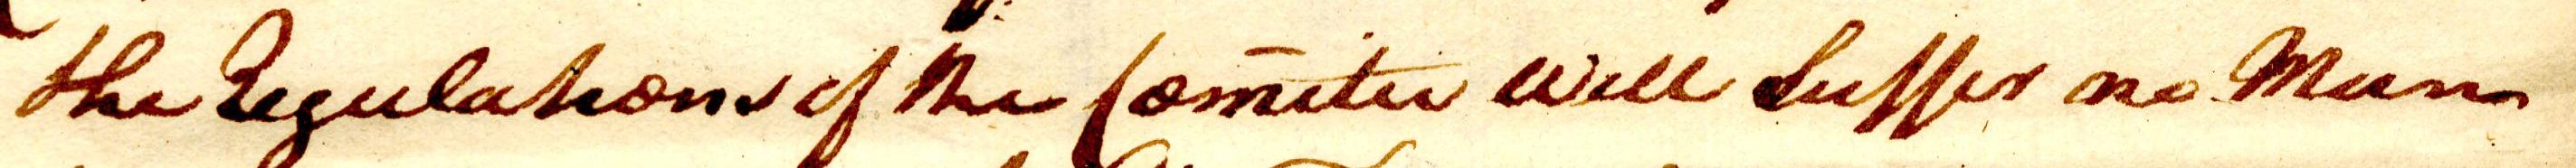the regulations of the Comitee will Suffer no Man
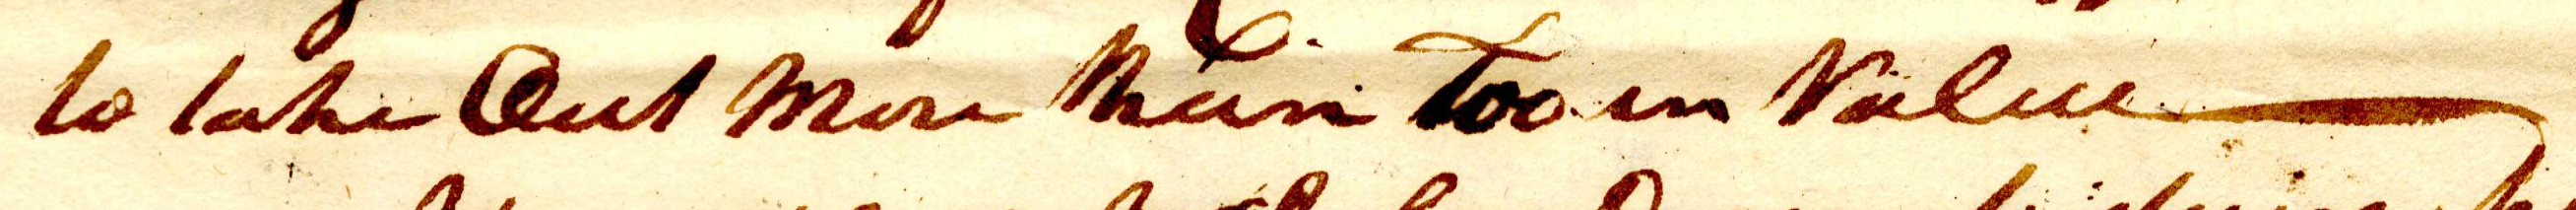to take out More than 100 in Value-
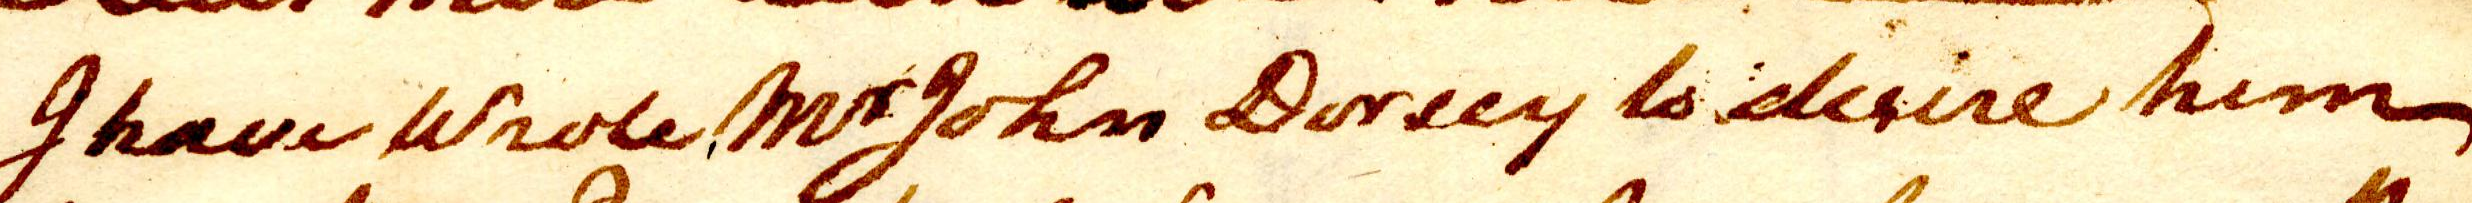I have Wrote M^r John Darcey to desire him
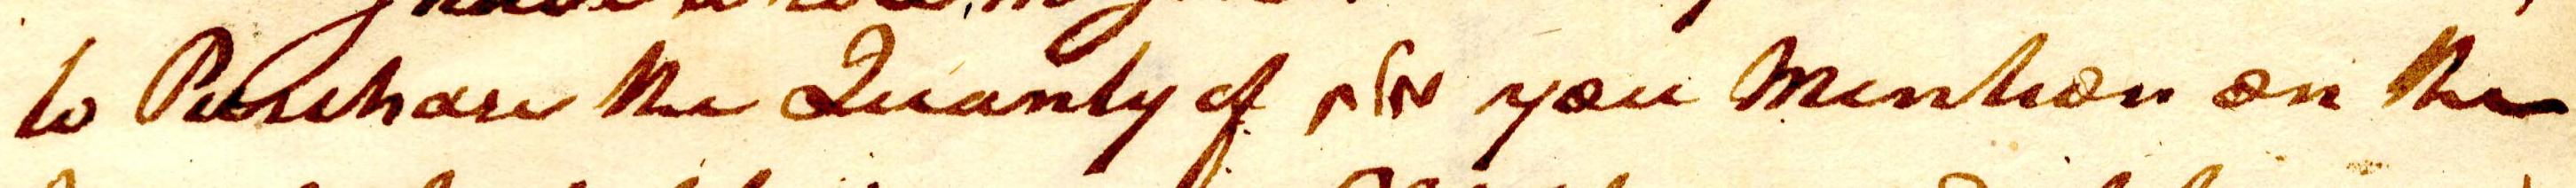to Purchase the Quanty of [___] you mention on the
